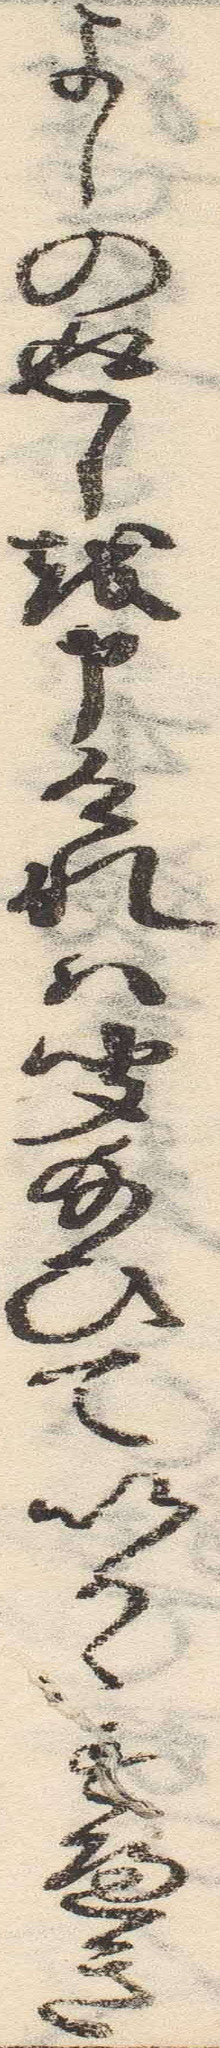よしの返しを申けれは聞給ひていかゝすへき
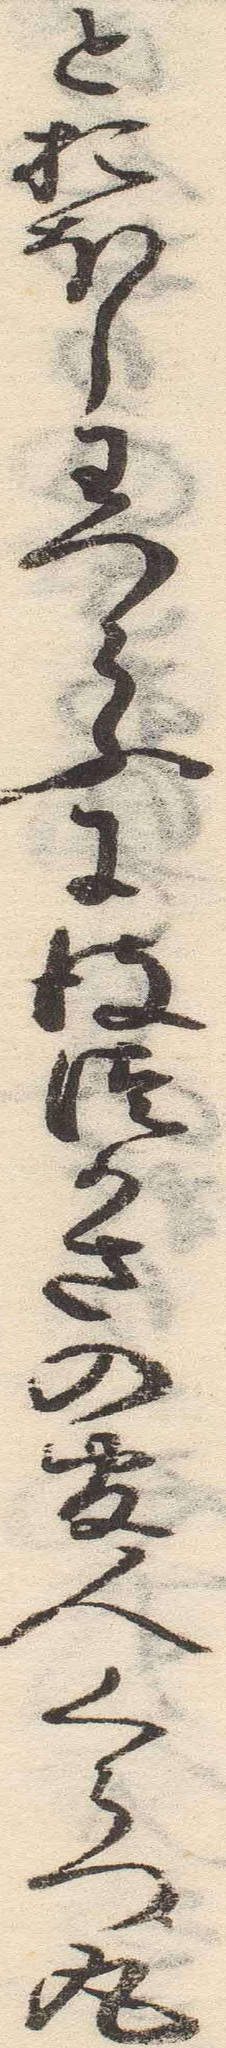とおほしわつらふに彼つかさの官人くらつ丸
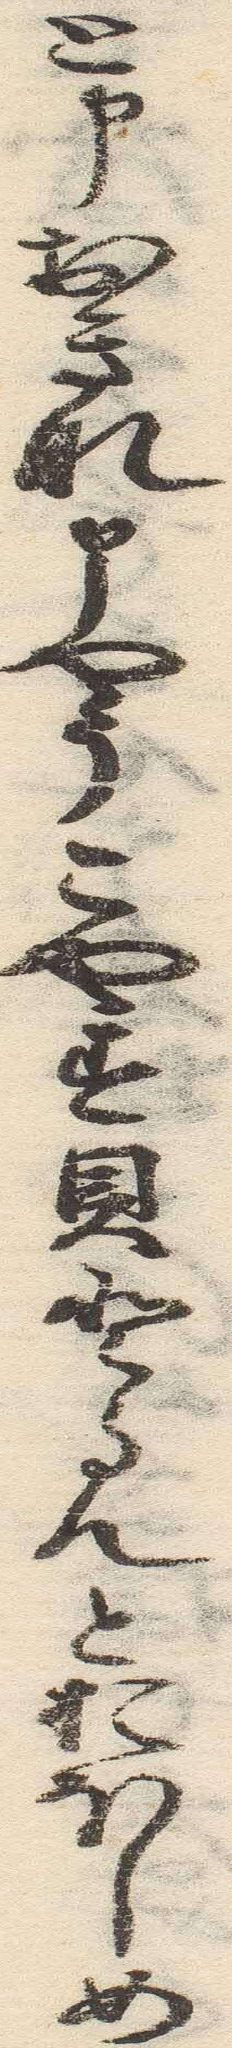と申おきな申やうこやす貝とらんとおほしめ
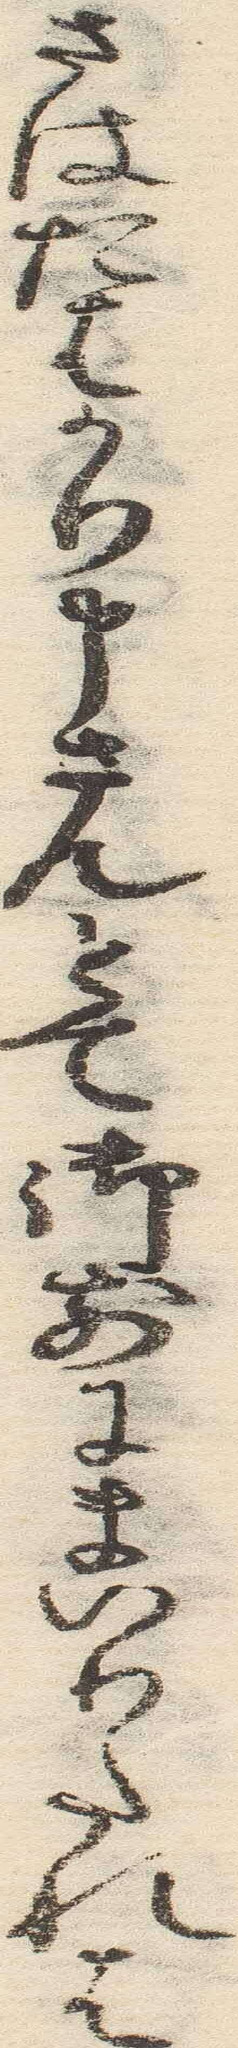さはたはかり申さんとて御前にまいりたれは
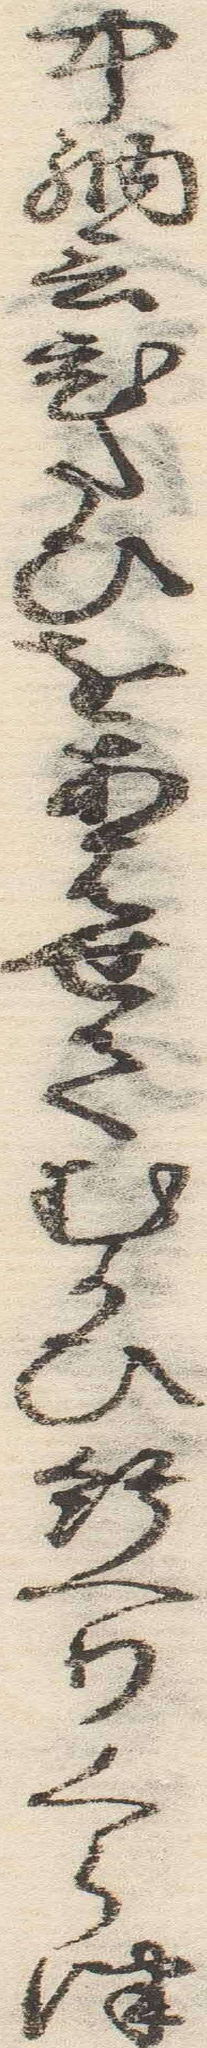中納言ひたひをあはせてむかひ給へりくらつ
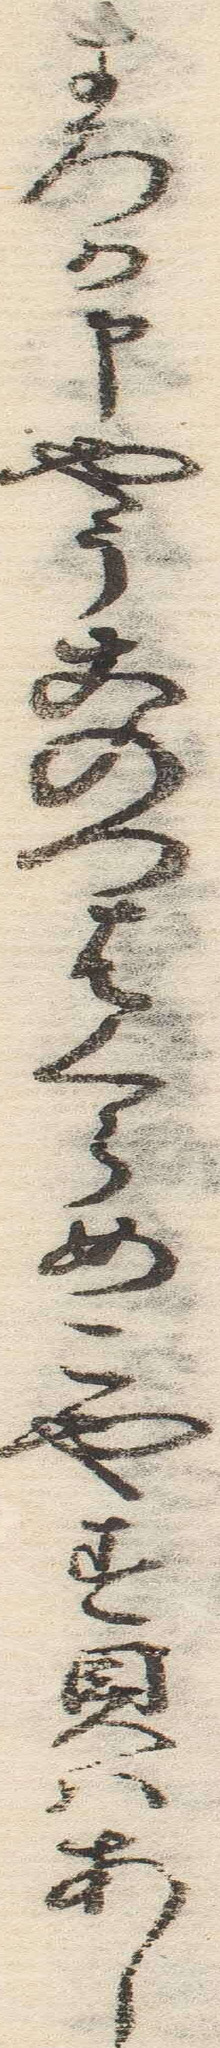まろか申やうこのつはくらめこやす貝はあし
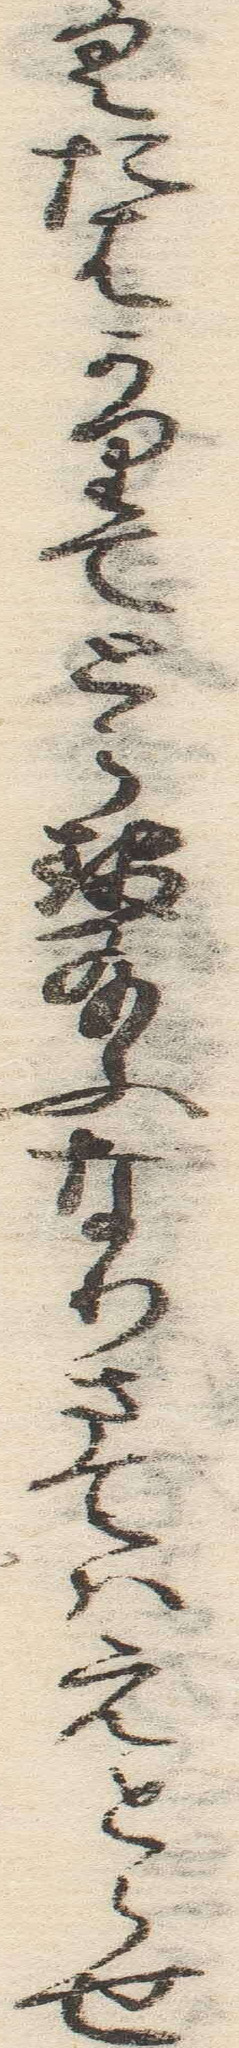くたはかりてとらせ給ふなりさてはえとらせ
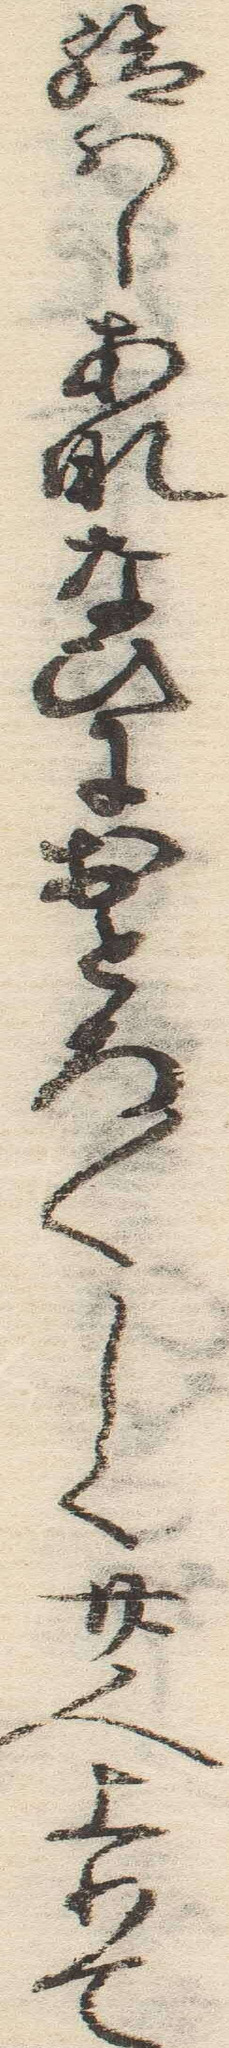給はしあななひにおとろ〳〵しく廿人上りて
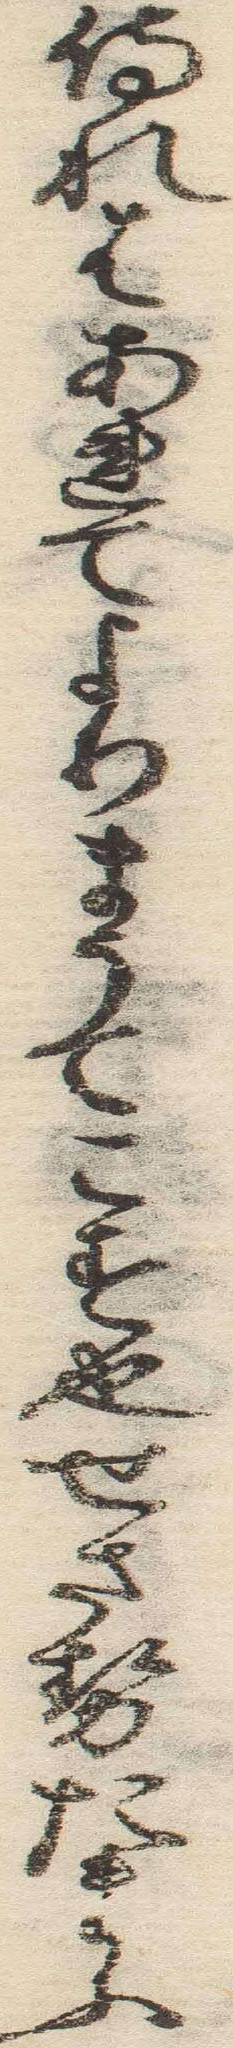侍れはあれてよりまうてこす也せさせたまふ
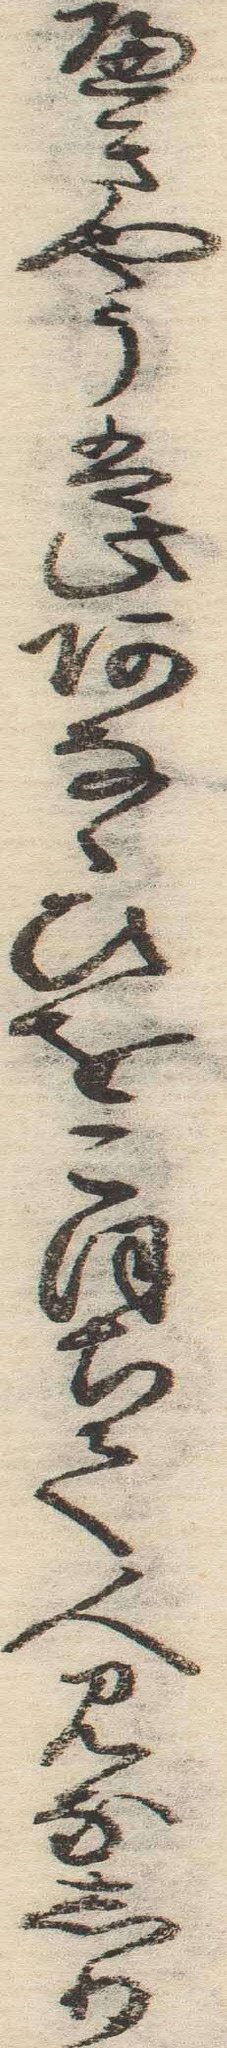へきやうは此あなゝひをこほちて人みなしり
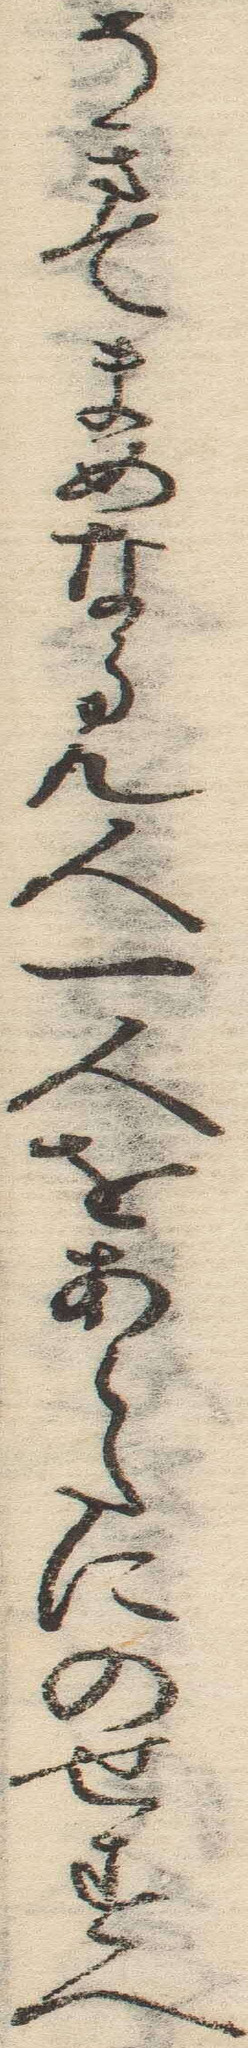そきてまめならん人一人をあしたにのせすへ

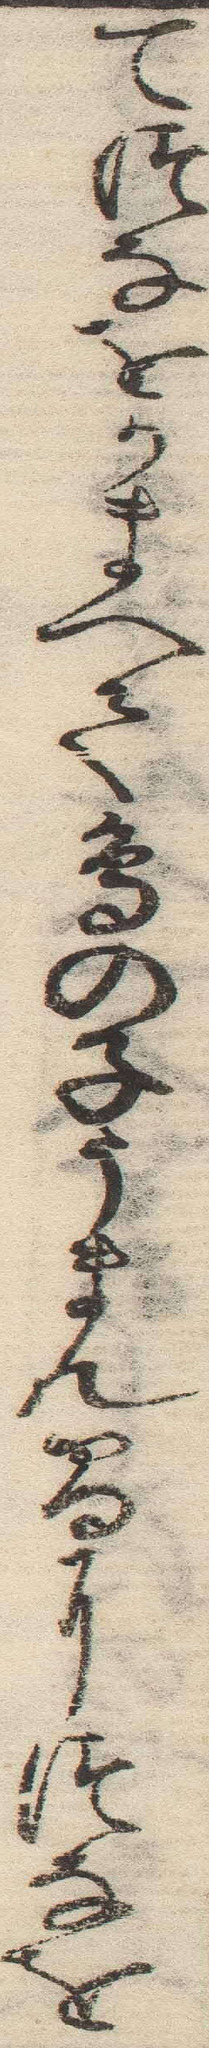てつなをかまへて鳥の子うまん間につなを
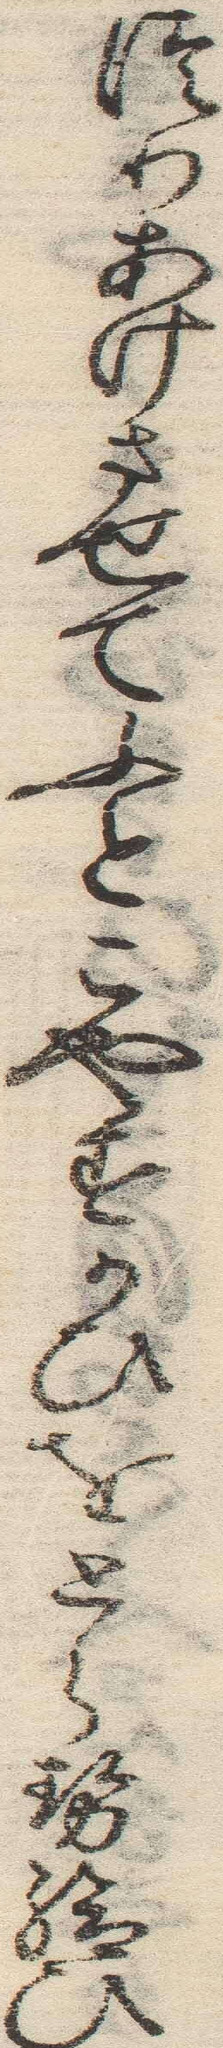つりあけさせてふとこやすかひをとらせ給ひ
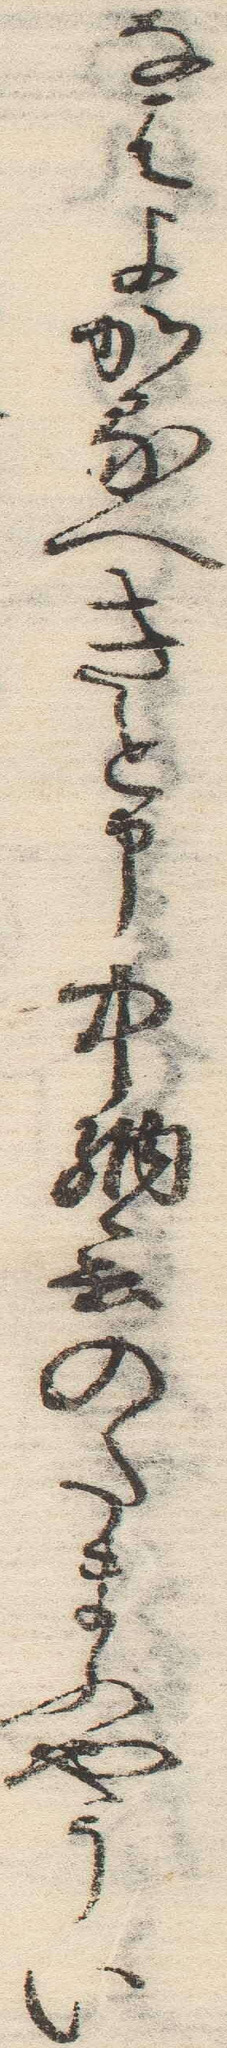なはよかるへきと申中納言のたまふやうい
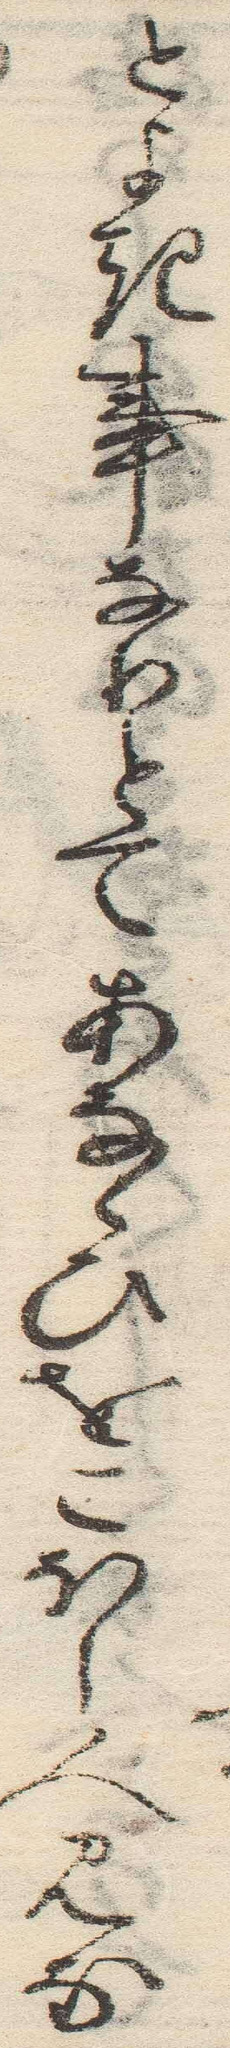とよき事なりとてあなゝひをこほし人みな
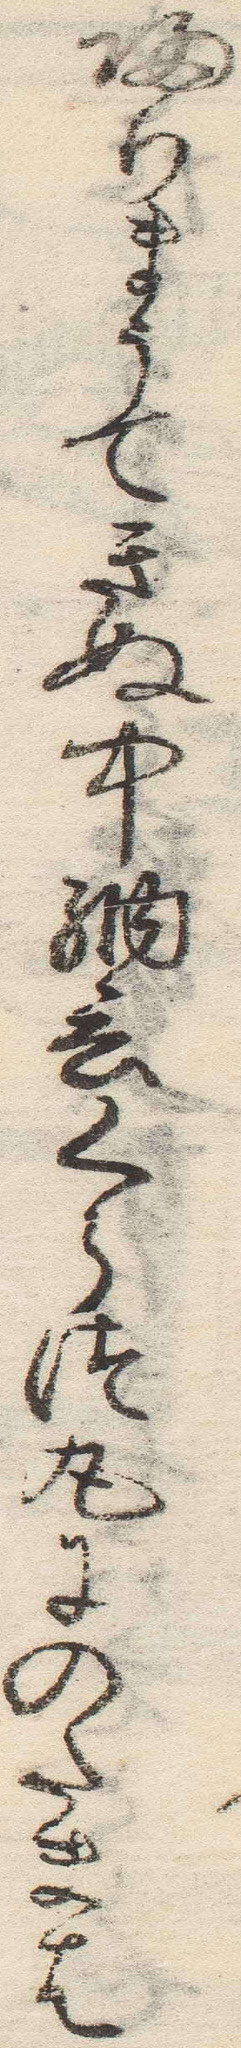帰りまうてきぬ中納言くらつ丸にのたまは
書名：竹取物語
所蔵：東京学芸大学附属図書館 国文学研究資料館
